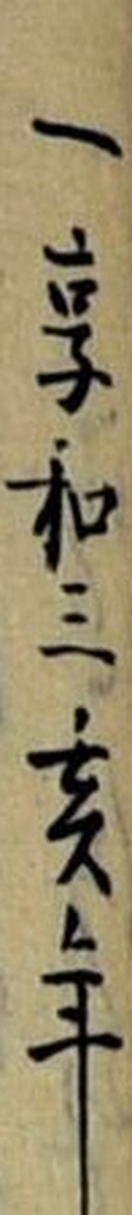一享和三亥年
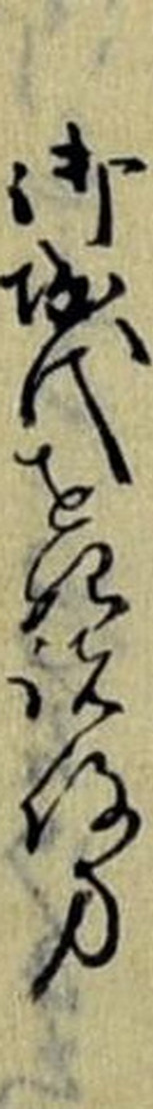御城代を始諸役方
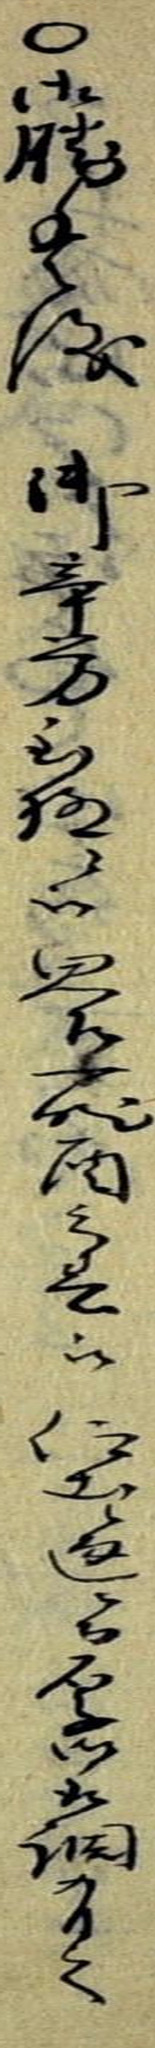○御勝手之儀御辛労至極に被思召一昨酉之春被仰出候通に而厚御取調有之
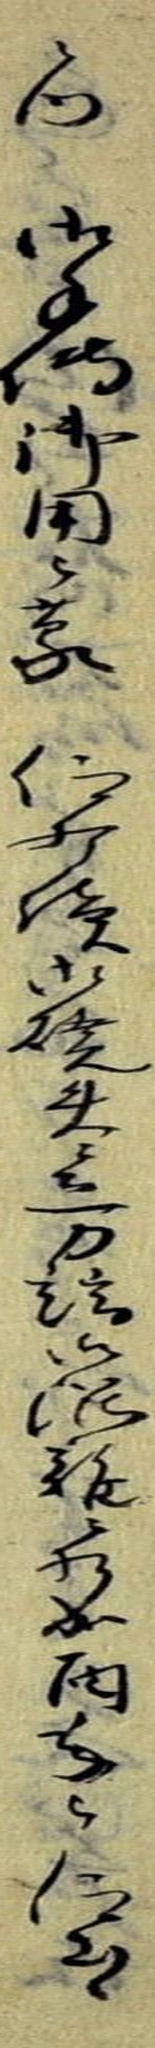候内御手伝御用被蒙仰付儀は御焼失に而万端御澁難に相成酉年被仰出候
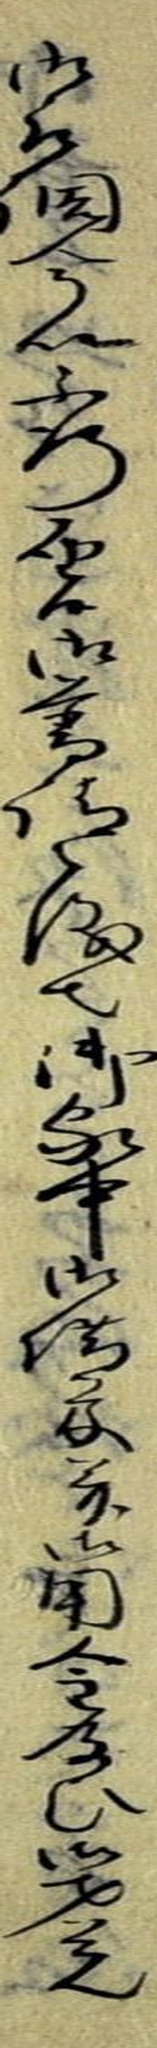御取個今以不行届候御普請之儀は御家中御借米并御用金及び御才覚
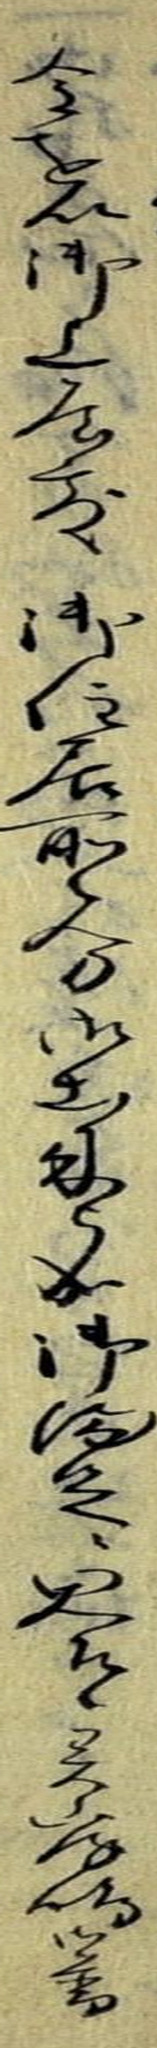金を以御上屋敷へ御住居所之分御出来被成御満足被思召候霊厳嶋御普
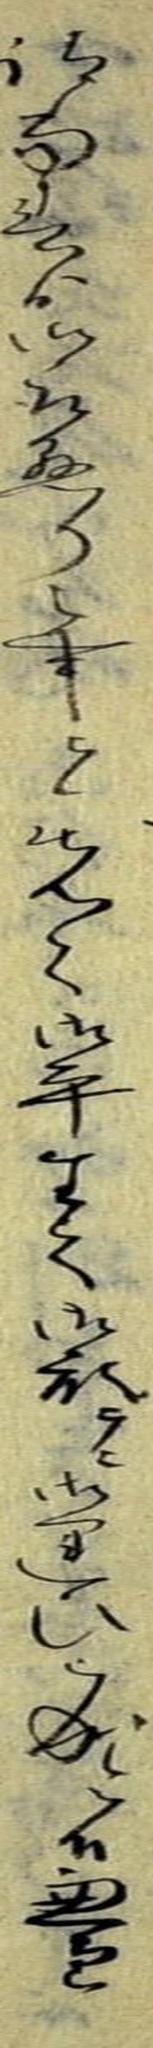請当春ゟ御取懸り之事に候先々御平生之御形チに被御運ひ被成候に付兼而被
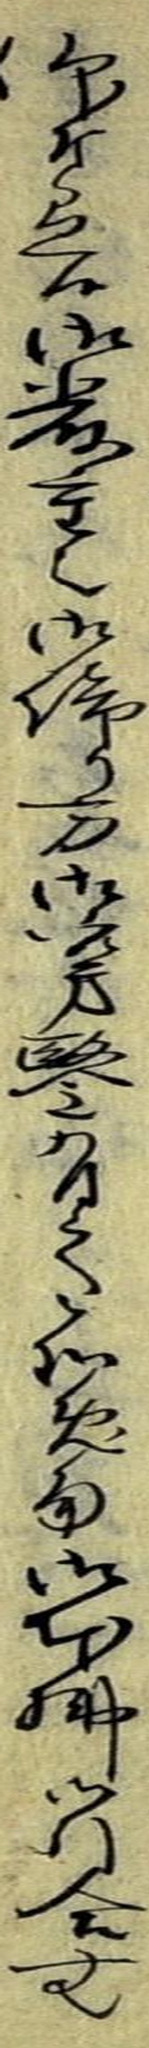仰付置候御厳重之御締り方御穿鑿有之候処兎角御本払御引合無
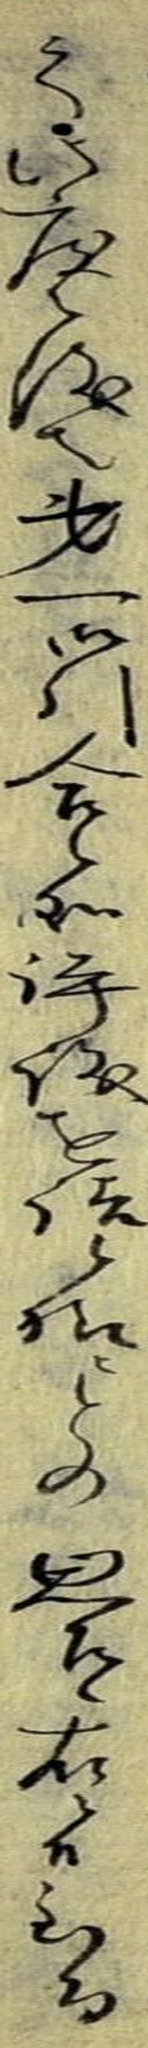之此度之儀は第一御引合候処評議を詰候様にとの思召候右に付至而
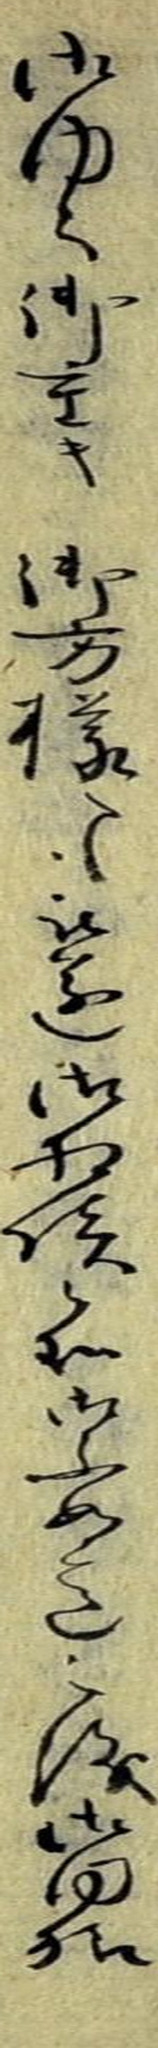御内々御重キ御方様へも被遂御相談候処御不如意之儀御同様
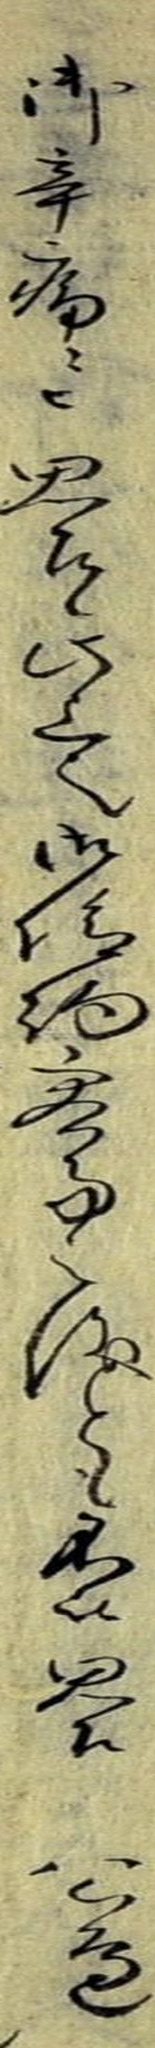御辛痛に被思召候此上之御倹約実事之儀とも不被思召候公辺
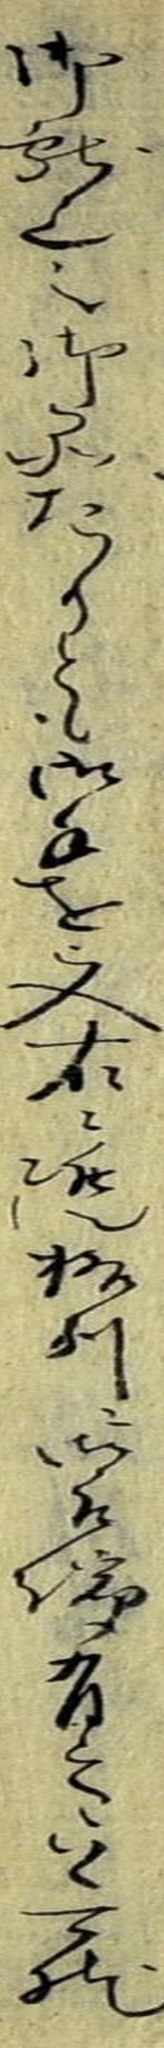御献上之御品たりとも御手を被入右に准し格別に御取縮メ有之候はヽ可然
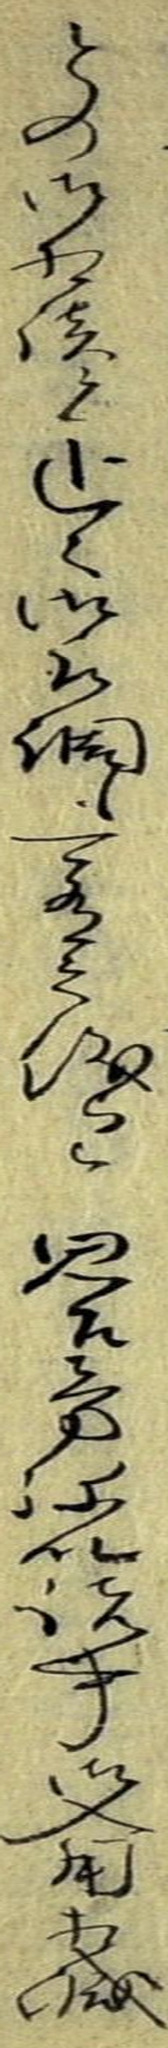との御相談に候追々御取調も可有之儀と被思召旁弥以諸事御入用相減
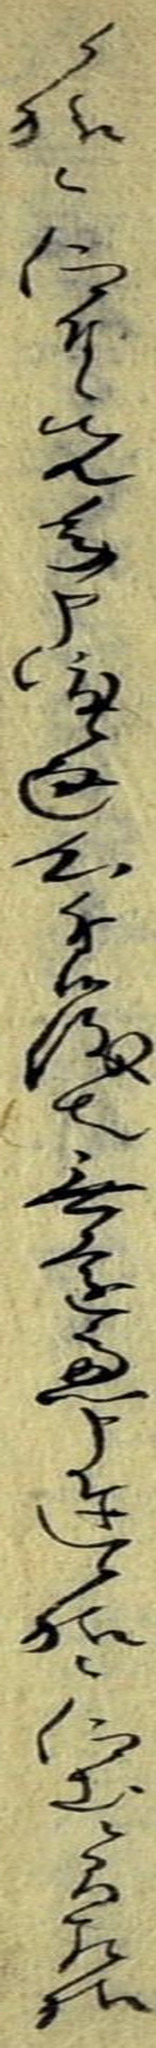候様被仰付候先年申渡候趣心付候儀は無遠慮申達候様被仰出候間左様
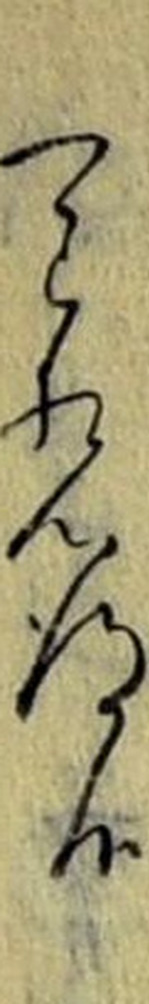可被相心得候

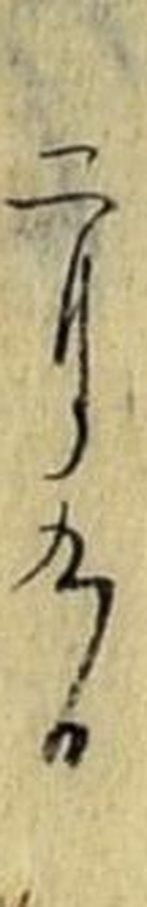二月九日
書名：命令之部 四
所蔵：福井県文書館 Fukui Prefectural Archives
